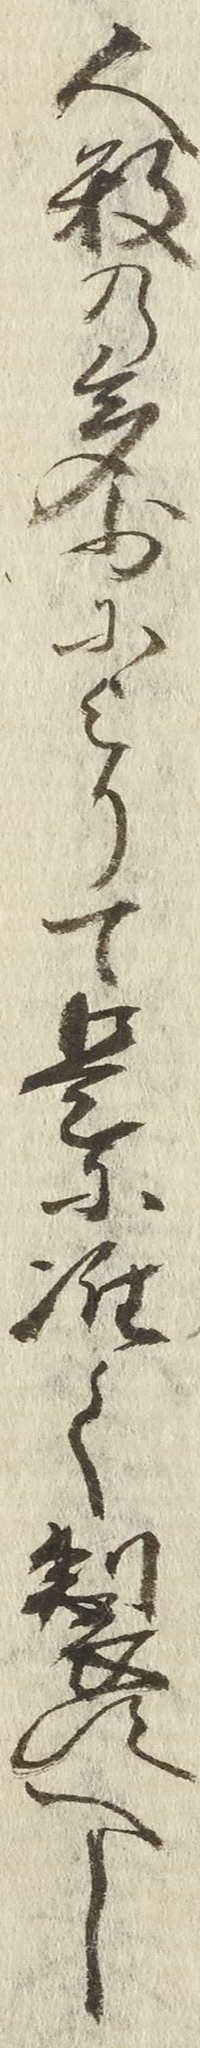人数の多少によりて是に准て製すへし
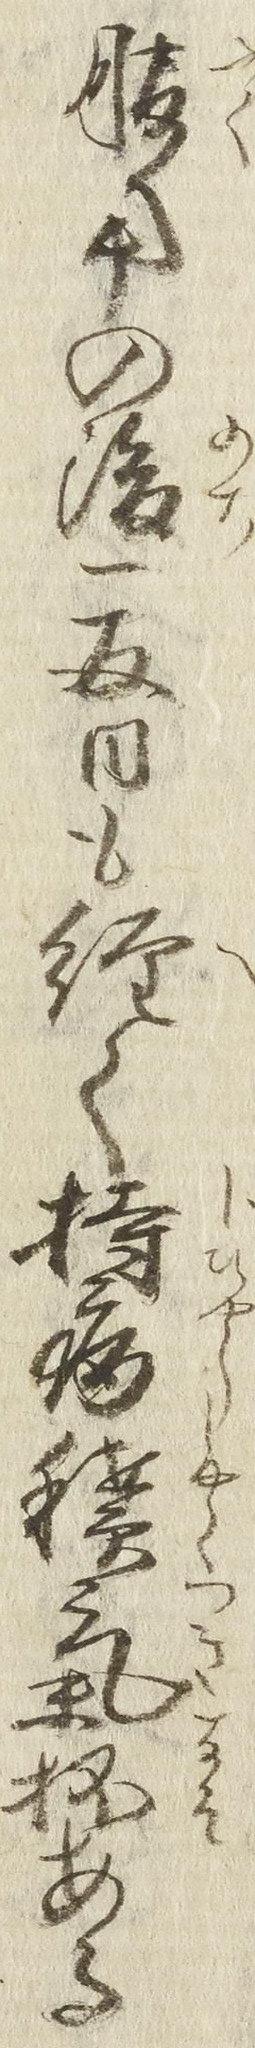服用の後一両日も経て持病続気抔ある
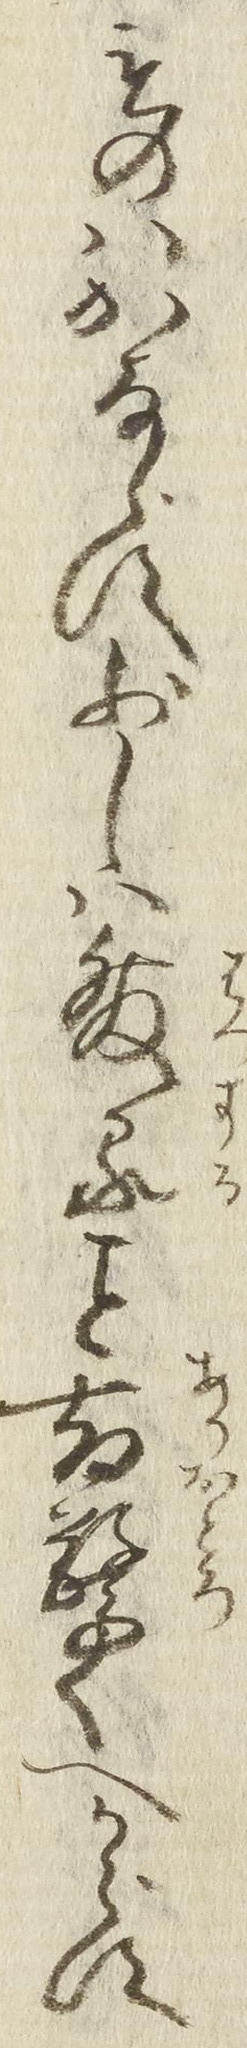ものはかならす少しは発累こと有驚くへからす
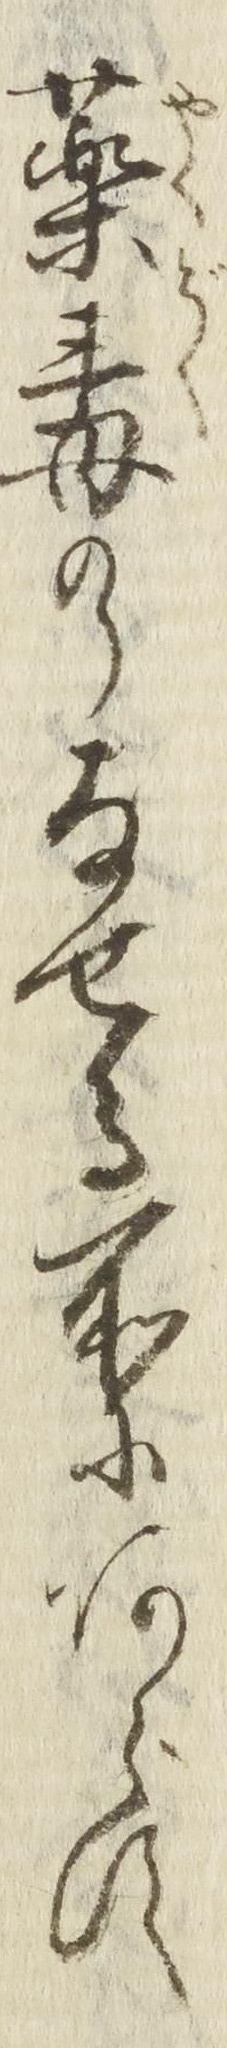薬毒のなせる所にあらす
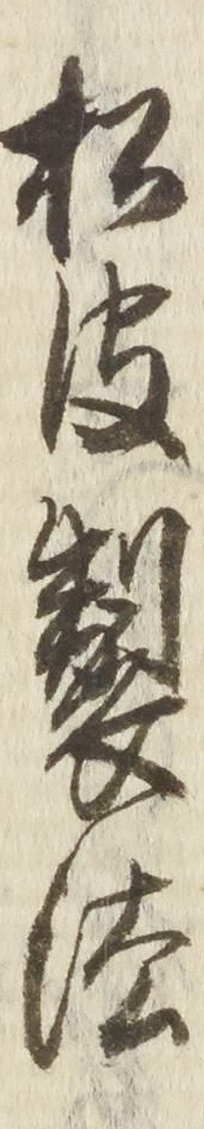松皮製法
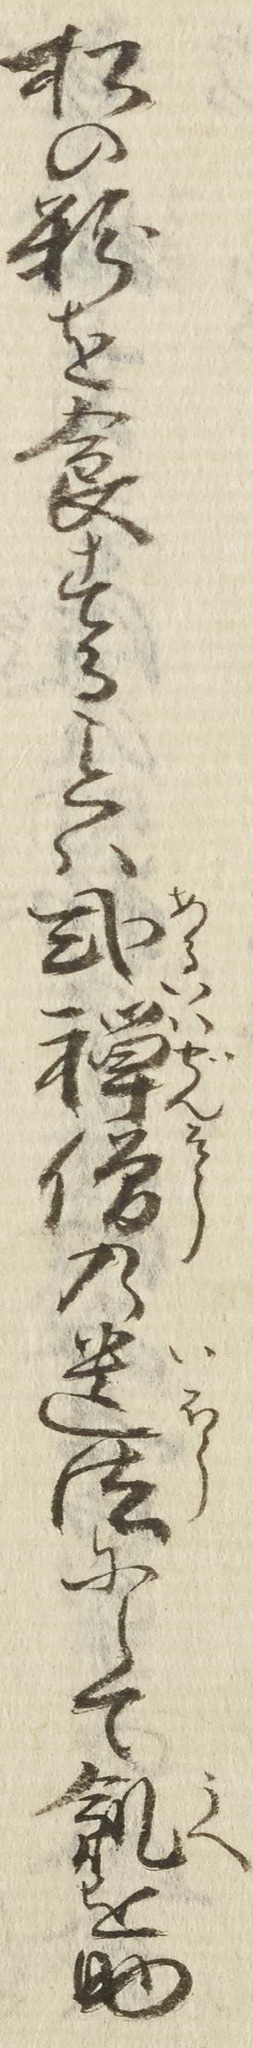松の粉を食することは或禅僧の遺法にして飢を助
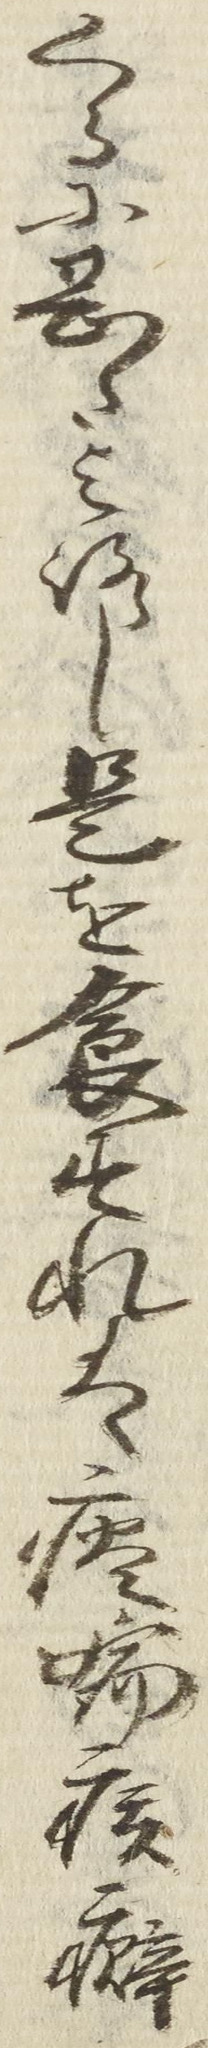くるに甚たよろし是を食すれは痰喀疾癖
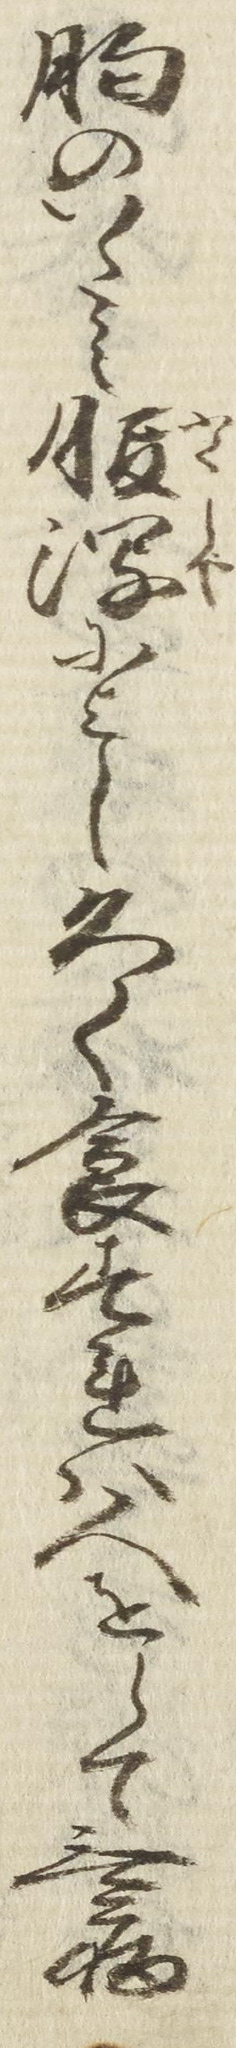胸のいたみ腹瀉によし久く食すれは人をして無病
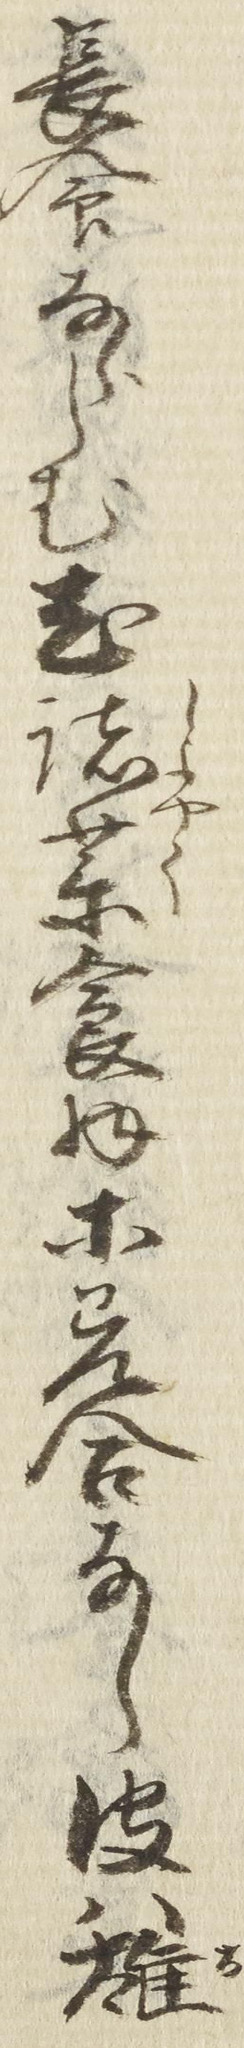長命ならしむ尤諸薬食物等差合なし皮は雄
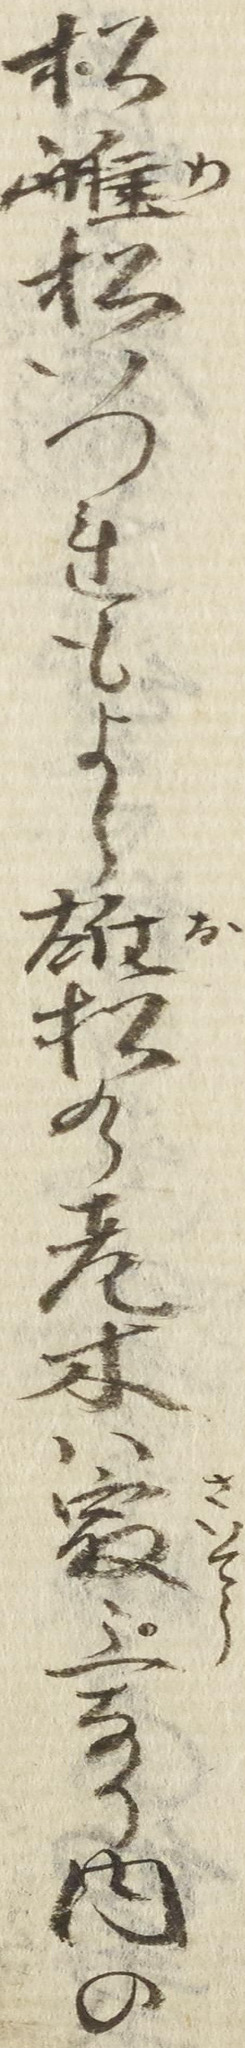松雌松いつれもよし雄松の老木は最上なり内の
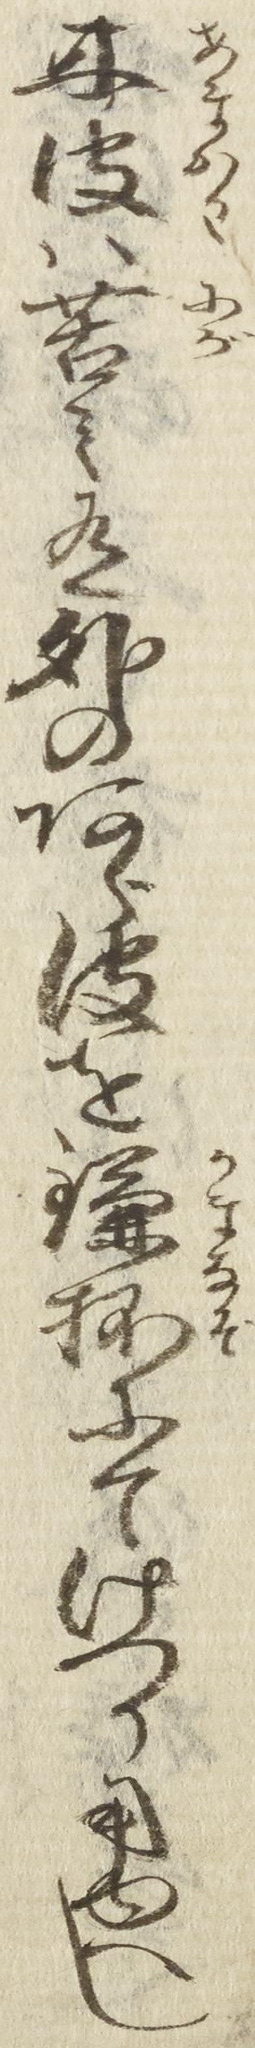甘皮は苦み有外のあら皮を鎌抔にてけつり用ゆへし

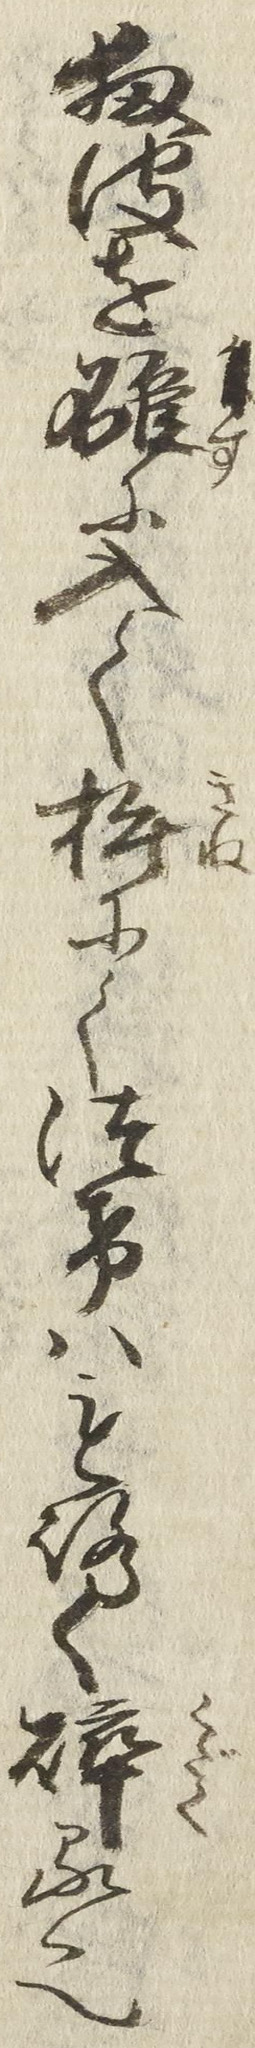扨皮を碓に入て杵にてつけはもろく砕る也
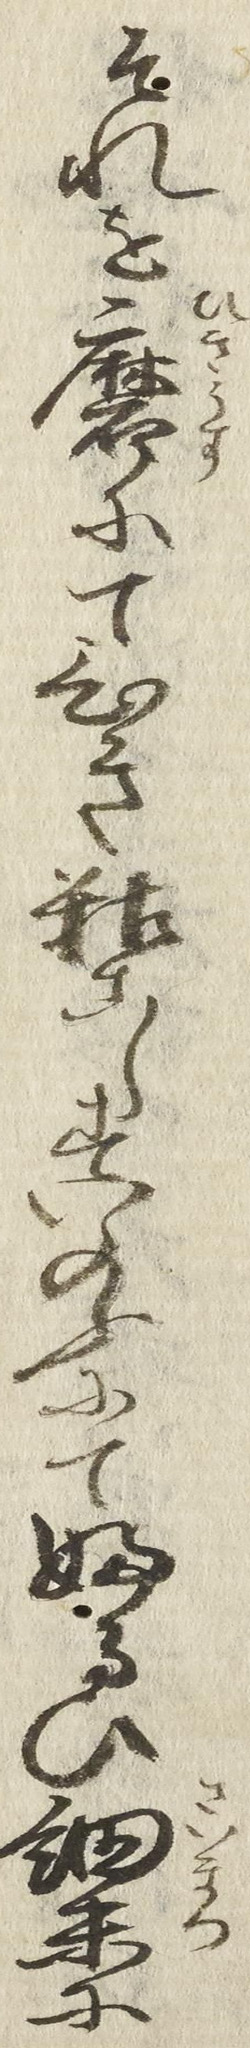それを磨にてひき粘こしすいのふにてふるひ細末に
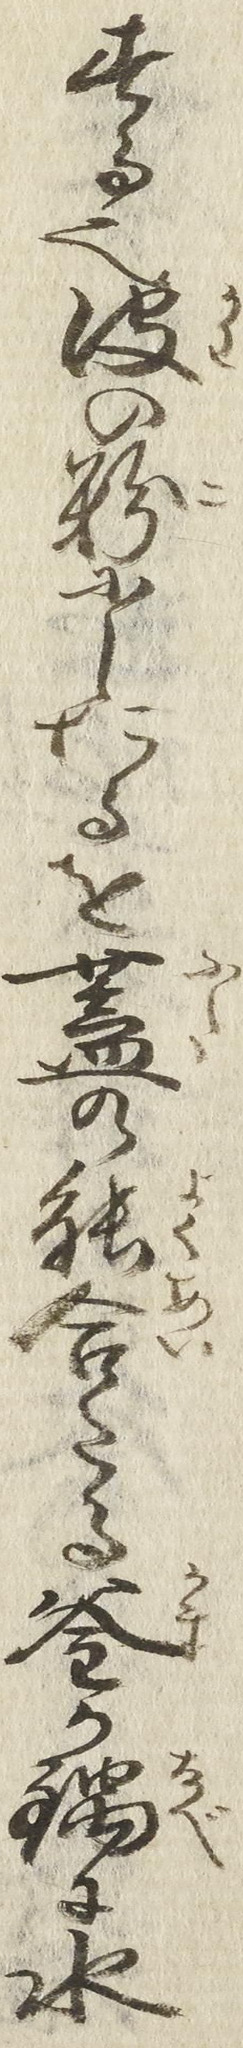する也皮の粉にしたるを蓋の能合たる釜か鍋に水
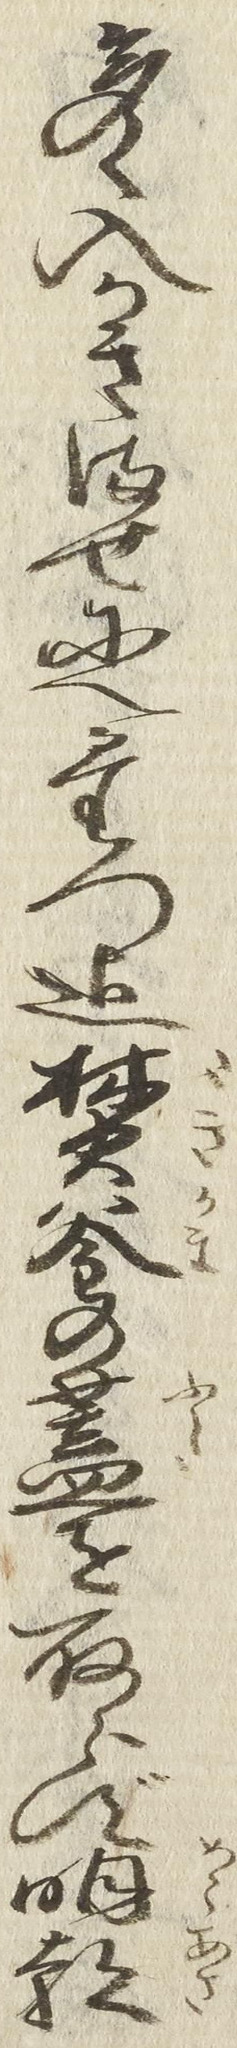多く入かきませにへたつ迄焚釜の蓋を取らず明朝
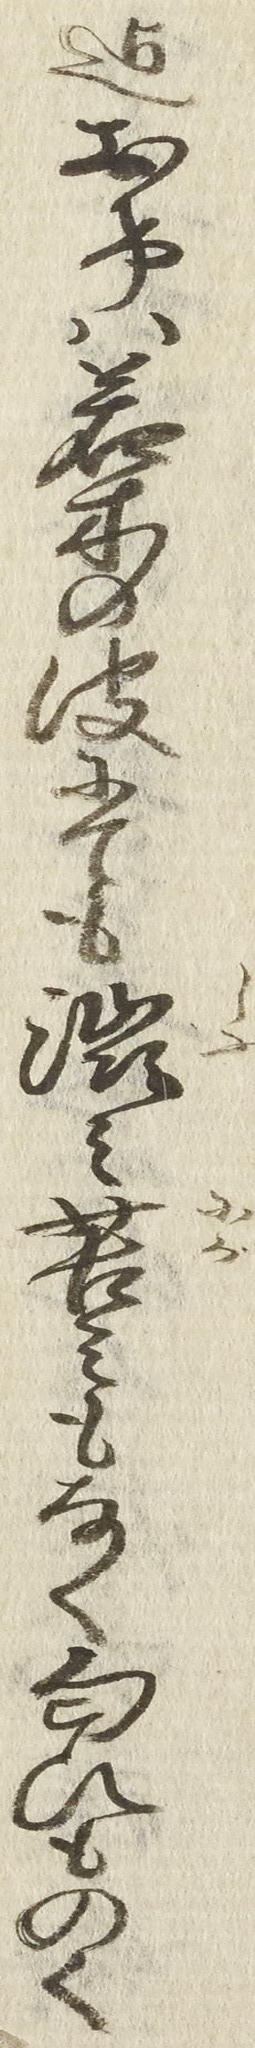迄おけは若木の皮にても渋み苦みもなく匂ひものく
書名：天明奇畧　全
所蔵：東京大学地震研究所図書室 Earthquake Research Institute Library, The University of Tokyo, JAPAN
